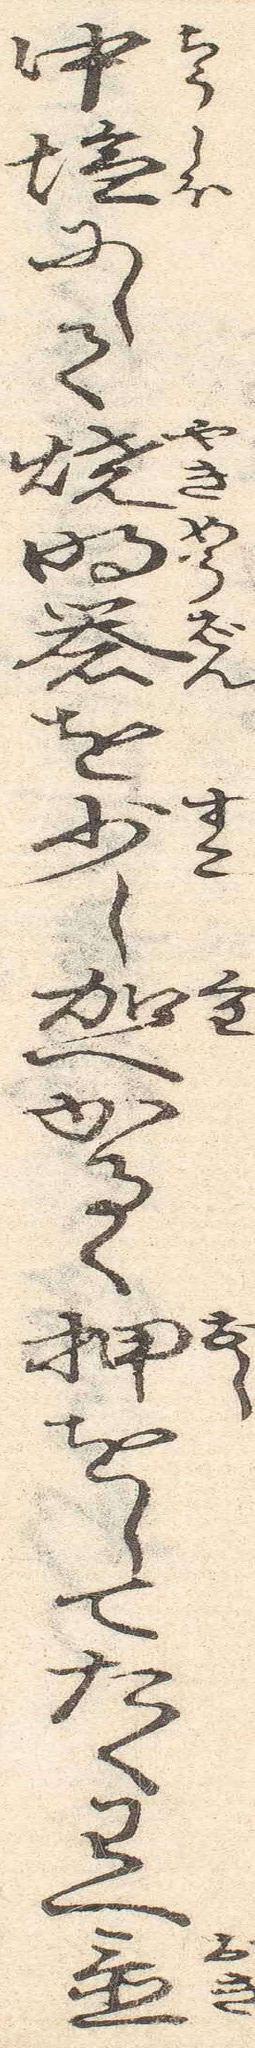中塩にして焼明礬を少し加へかるく押をしてたくはへ置
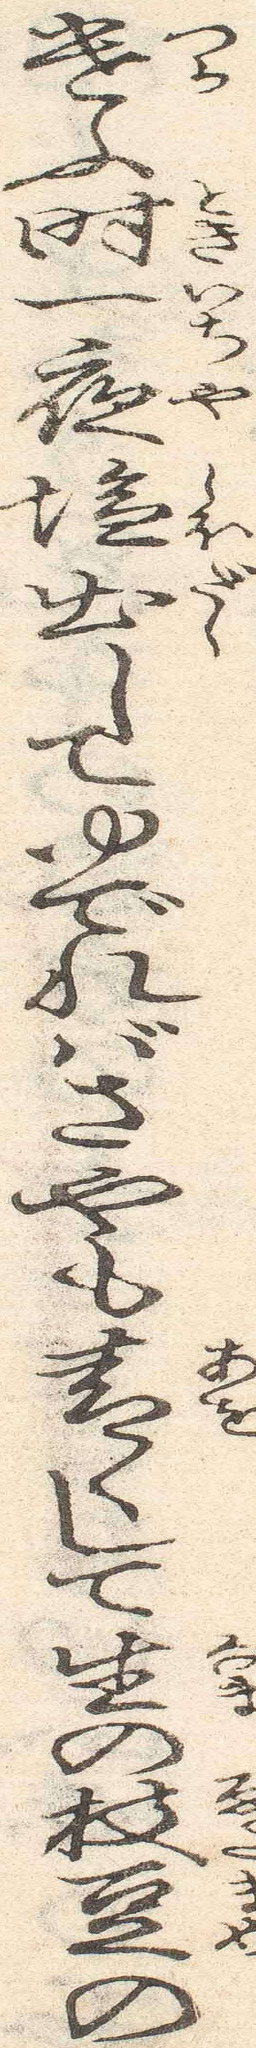遣ふ時一夜塩出してゆでればさやも青くして生の枝豆の
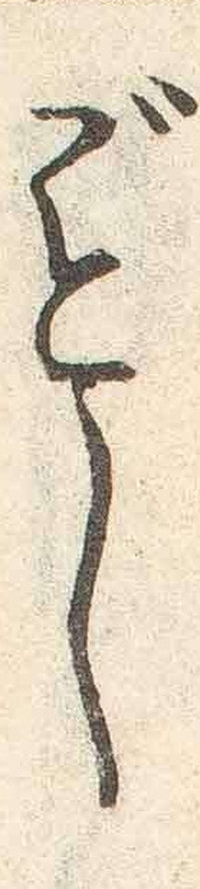ごとし
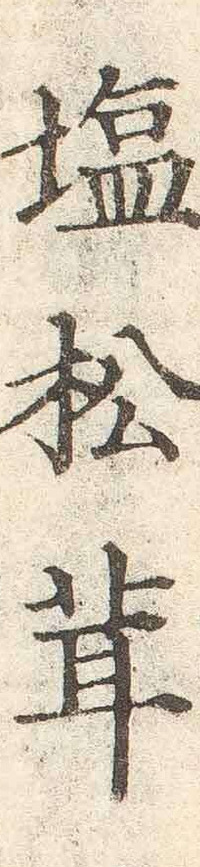塩松茸
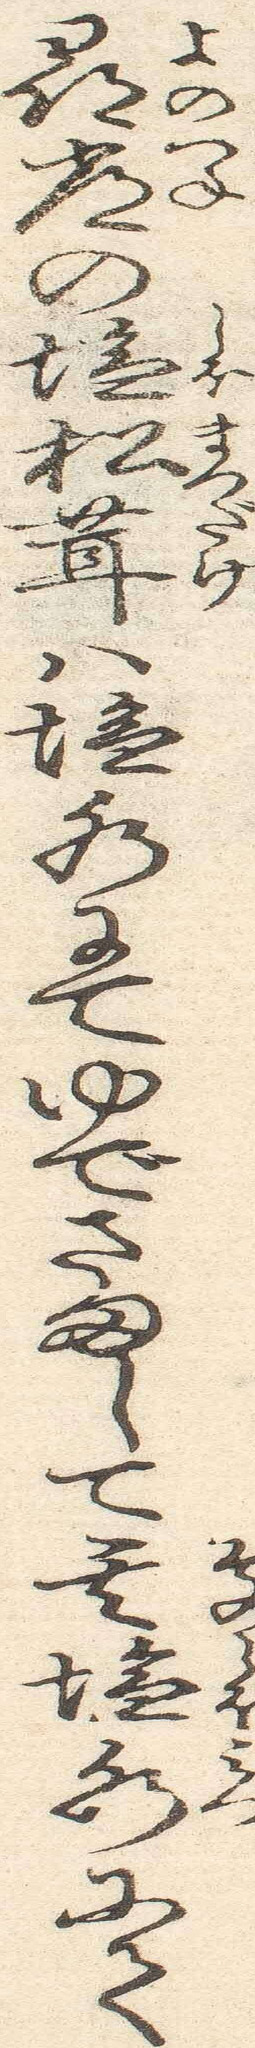尋常の塩松茸は塩水にてゆでさまして其塩水にて
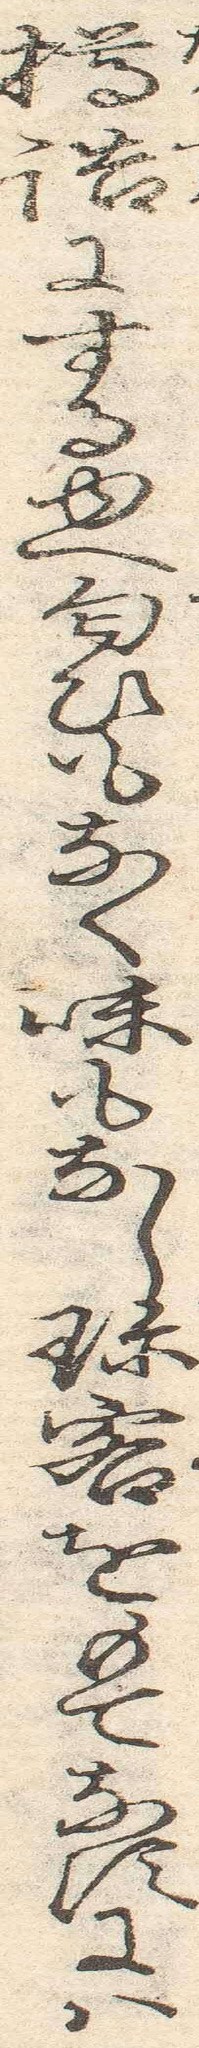樽詰にするゆへ匂ひもなく味もなし珍客をもてなすには
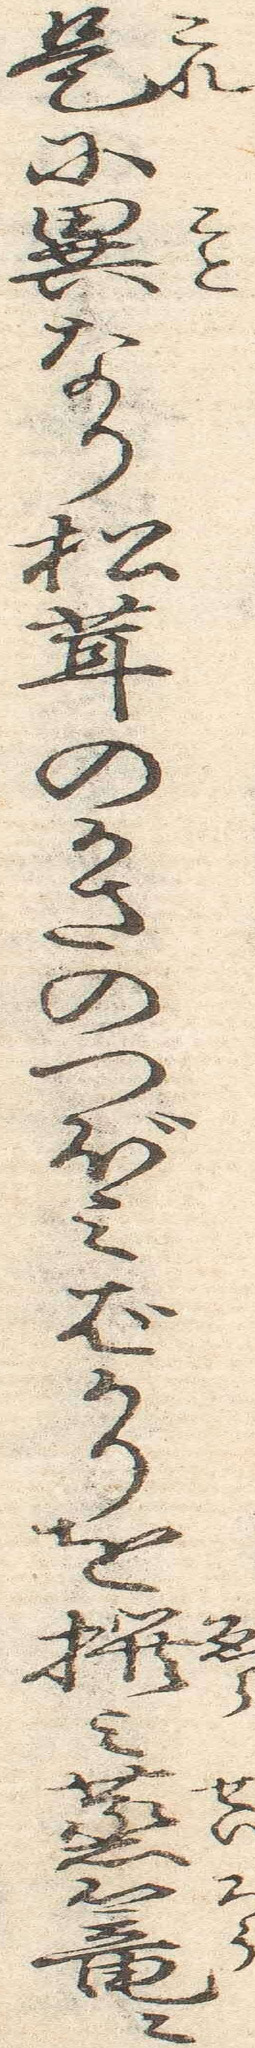是に異なり松茸のかさのつぼみばかりを撰み蒸籠に
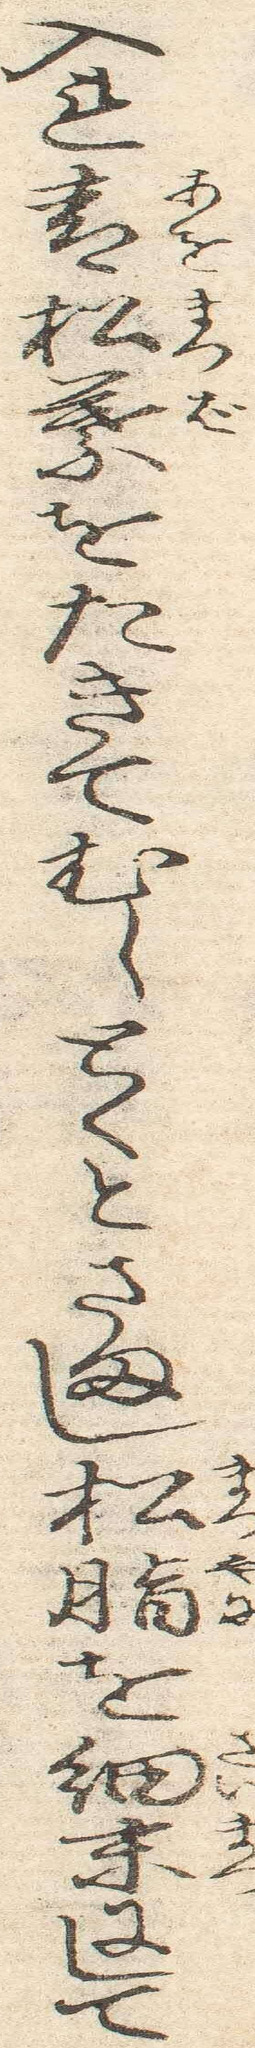入れ青松葉をたきてむしとくとさまし松脂を細末にして

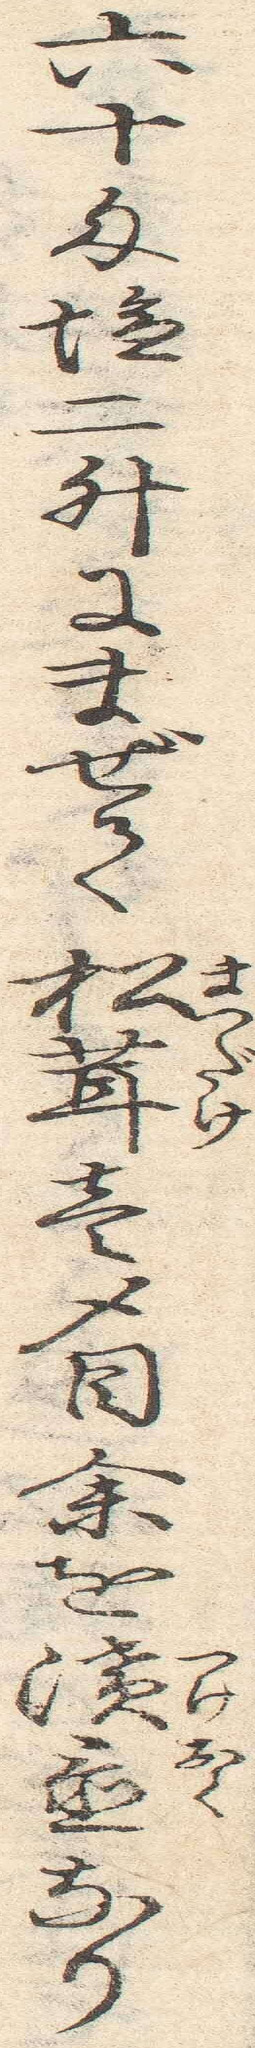六十匁塩二升にまぜて松茸壱貫目余を漬置なり
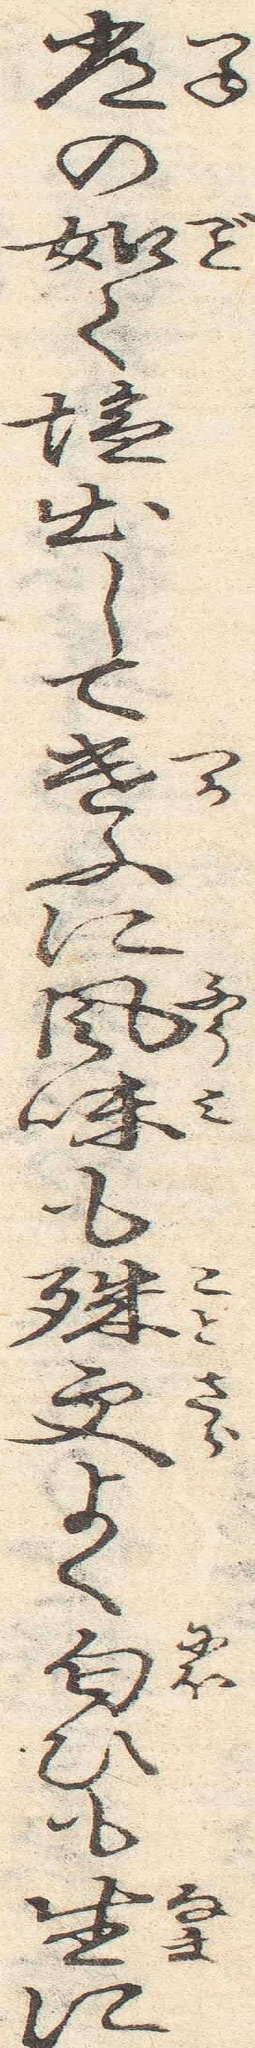常の如く塩出して遣ふに風味も殊更よく匂ひも生に
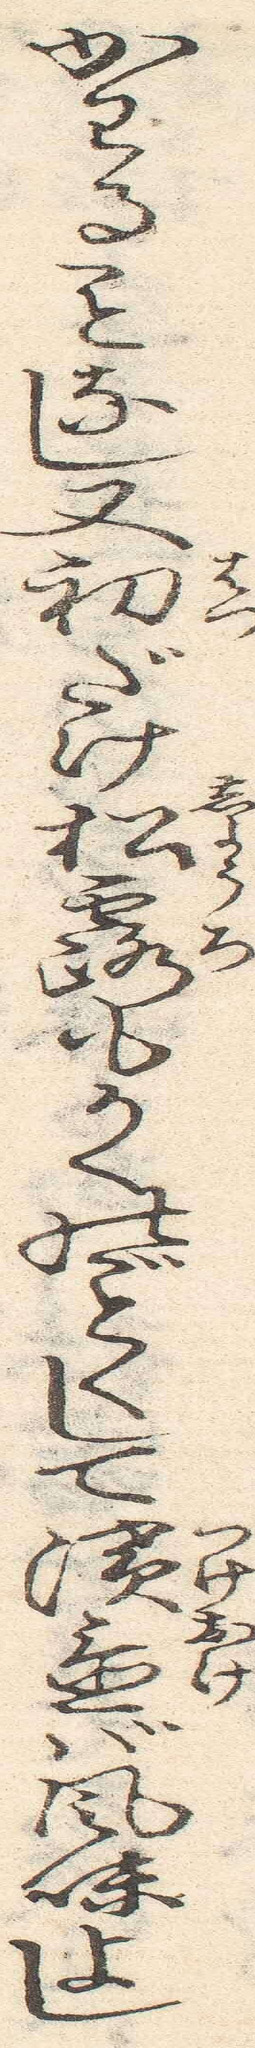かわることなし又初だけ松露もかくのごとくして漬置ば風味よし
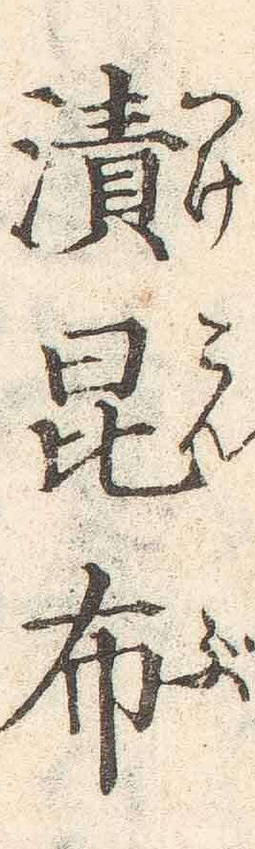漬昆布
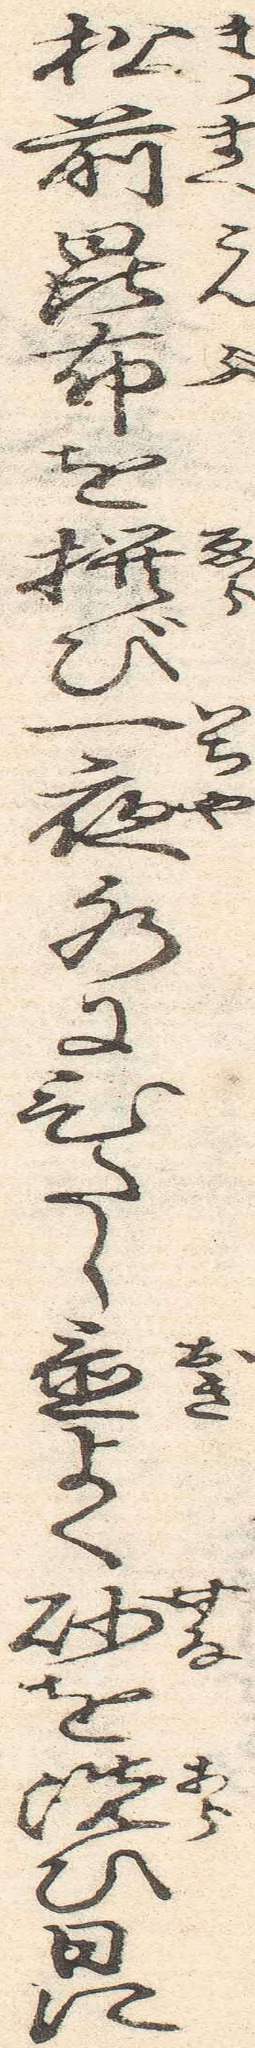松前昆布を撰び一夜水にひたし置よく砂を洗ひ日に
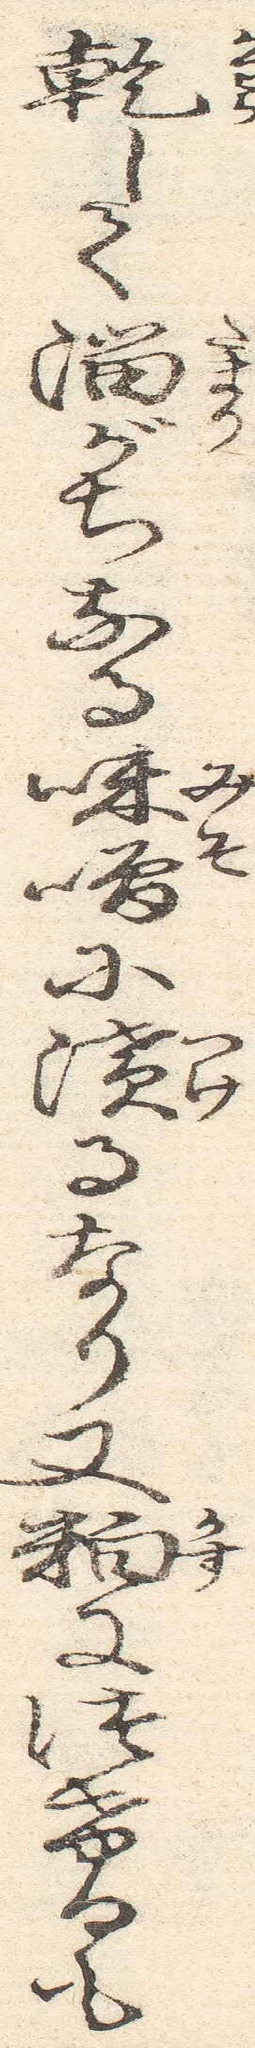乾して溜がちなる味噌に漬るなり又粕につけるも
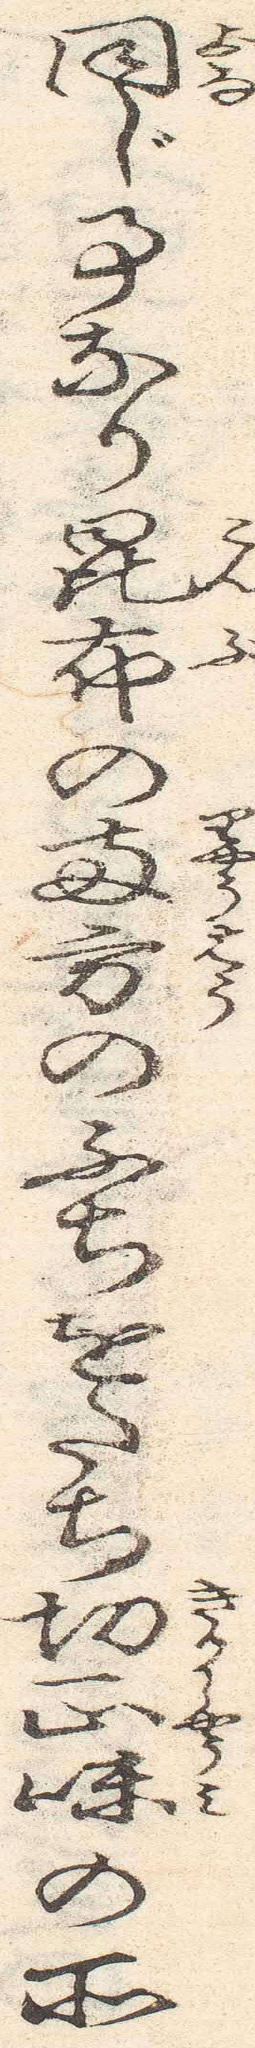同じ事なり昆布の両方のふちをたち切正味の所
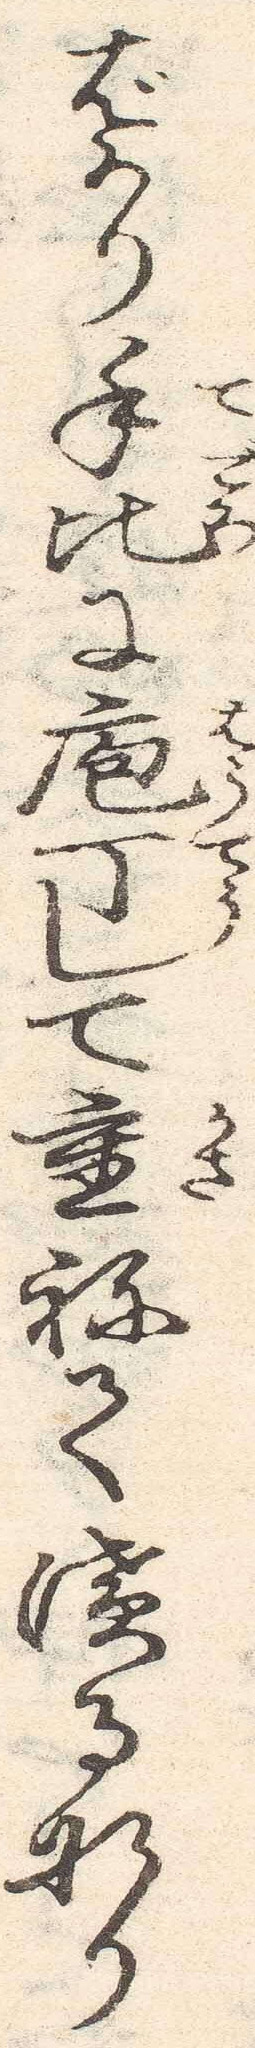ばかり手比に庖丁して重ねてつけるなり
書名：四季漬物塩嘉言
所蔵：東京学芸大学附属図書館 国文学研究資料館
